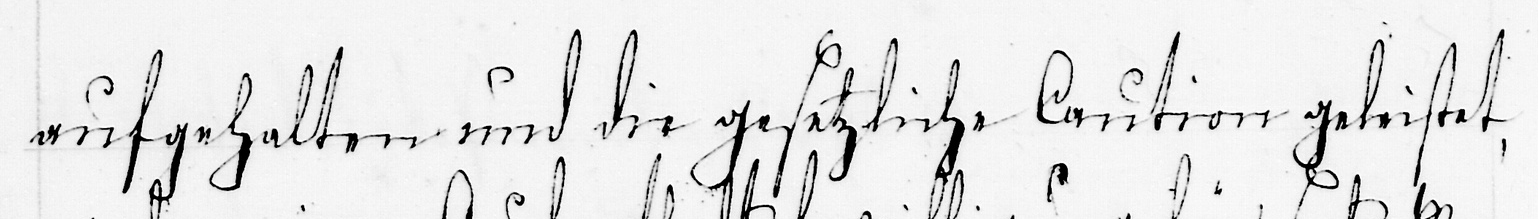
aufgehalten und die gesetzliche Caution geleistet,
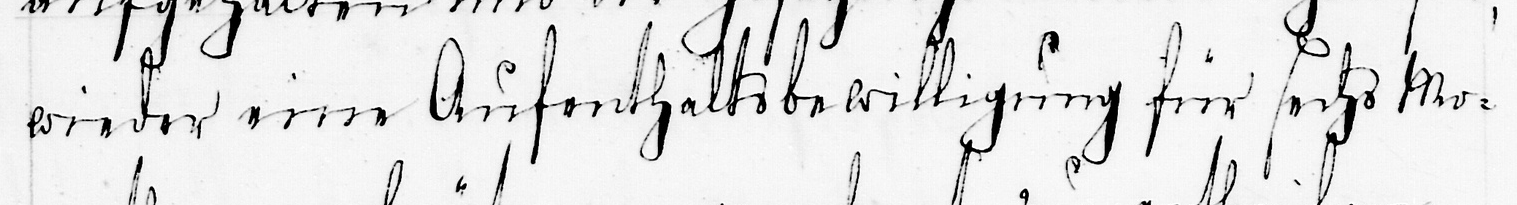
wieder eine Aufenthaltsbewilligung für sechs Mo¬
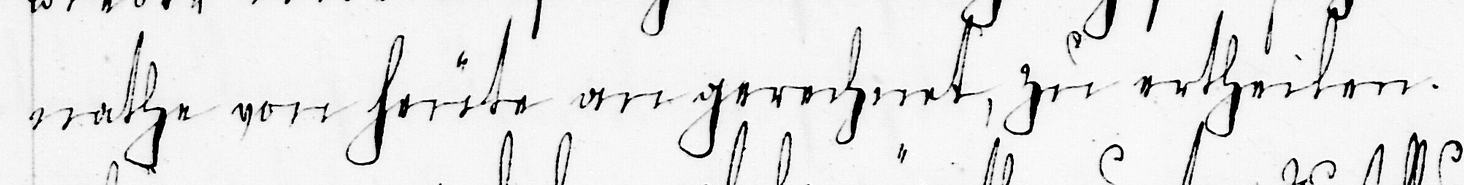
nathe von heute an gerechnet, zu ertheilen.
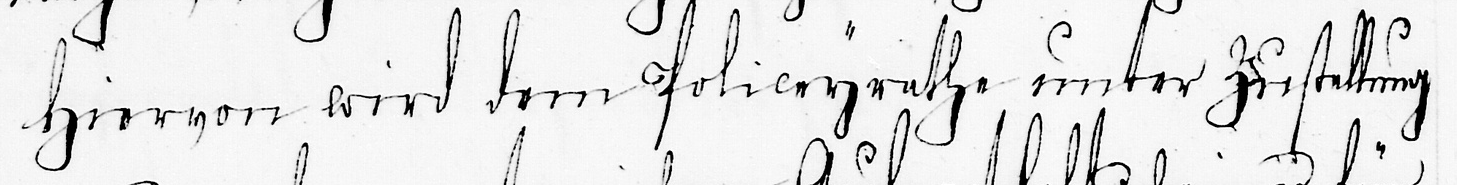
Hiervon wird dem Policeyrathe unter Zustellung
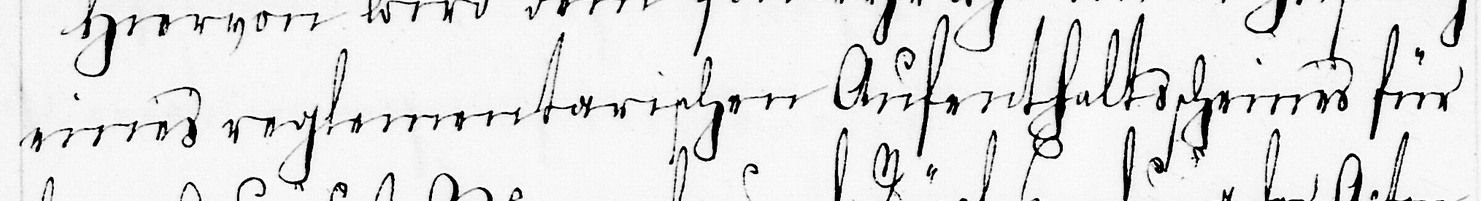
eines reglementarischen Aufenthaltsscheines für
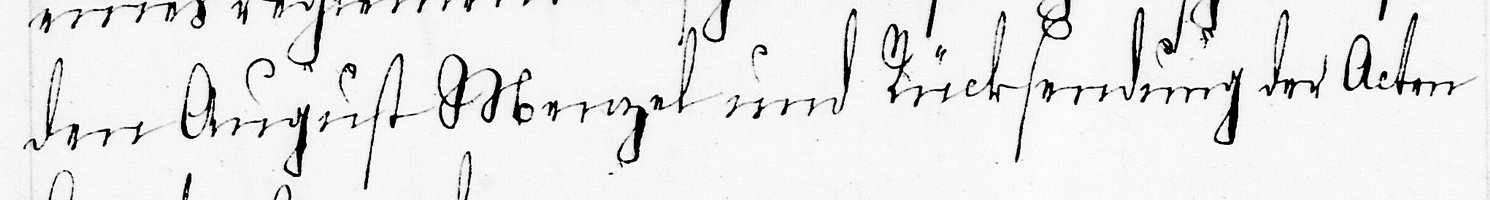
den August Menzel und Rücksendung der Acten
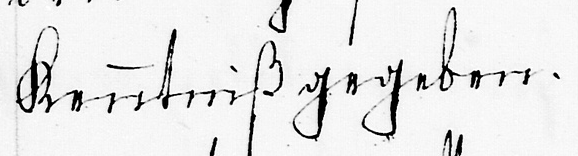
Kenntniß gegeben.
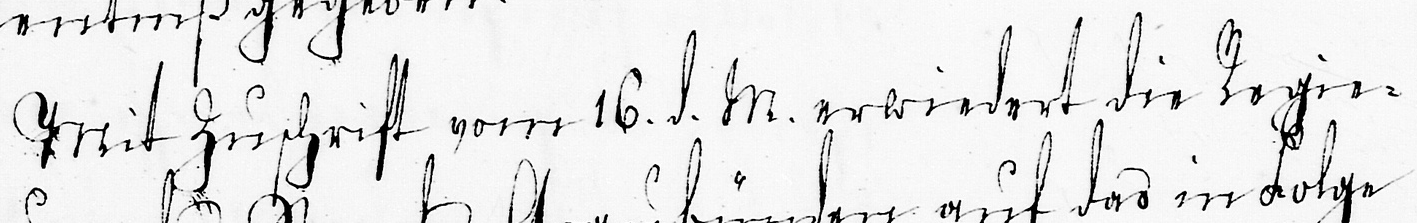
Mit Zuschrift vom 16. d. M. erwiedert die Regie¬
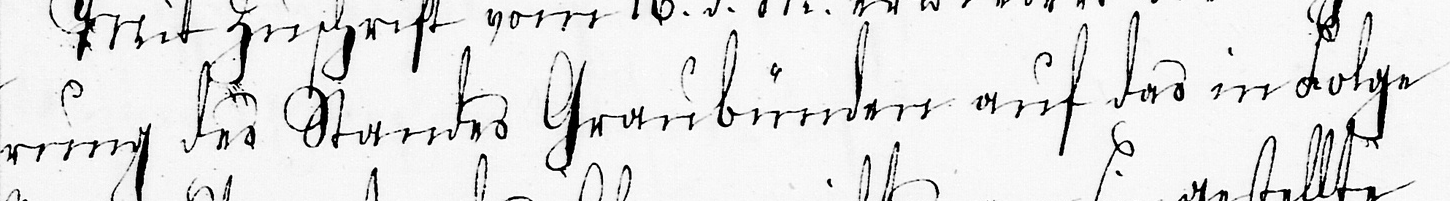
rung des Standes Graubünden auf das in Folge
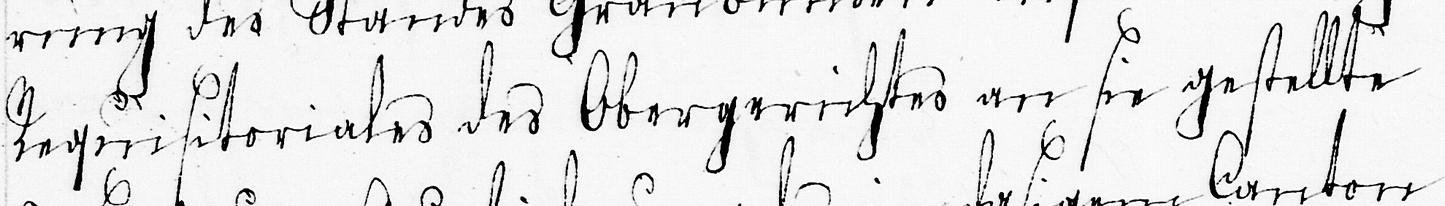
Requisitoriales des Obergerichtes an sie gestellte
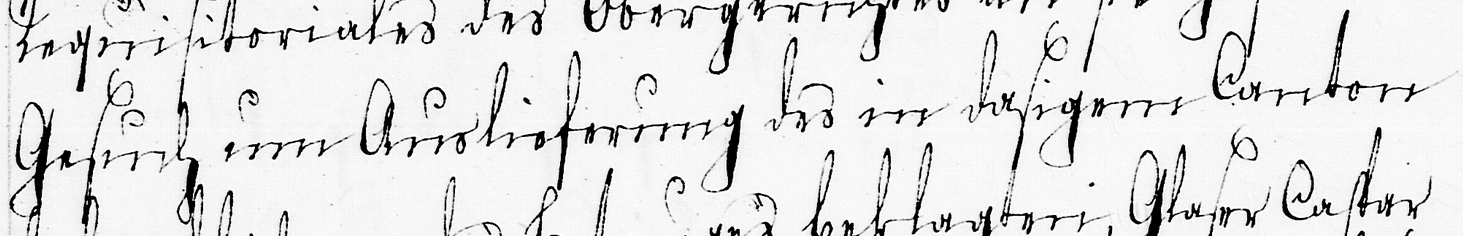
Gesuch um Auslieferung des in dasigem Canton
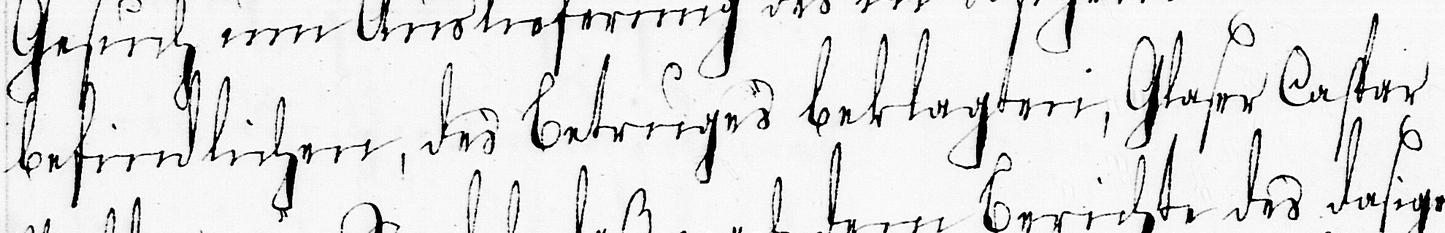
befindlichen, des Betruges beklagten, Glaser Caspar
